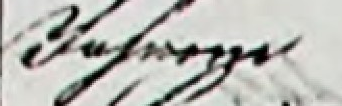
Johann
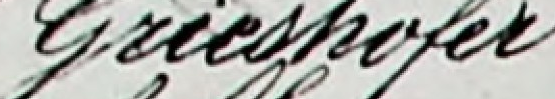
Grieshofer
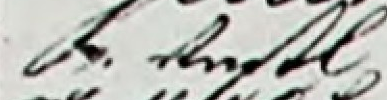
v. Rastl
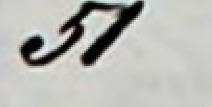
51
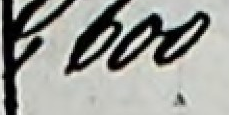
0,600
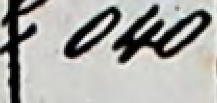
0,040
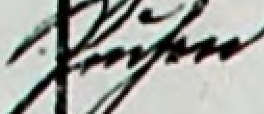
Puchen
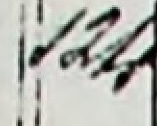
124
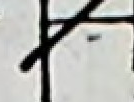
7
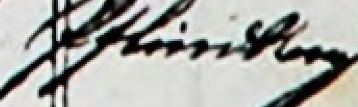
Pflindsberg
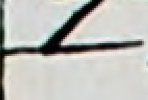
I
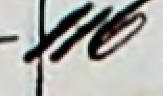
116
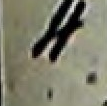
4
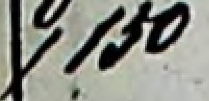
0,150
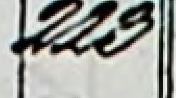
223
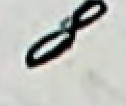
8
